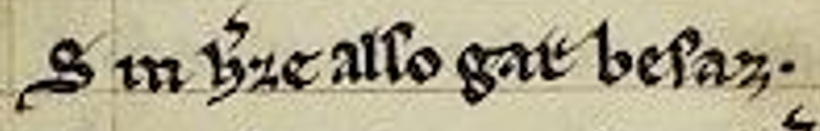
Sin h(er)ze alſo gar beſaz.
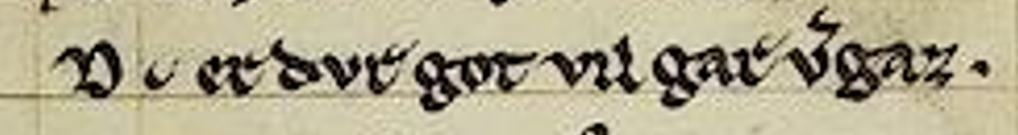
D(az) er dvr got vil gar v(er)gaz.
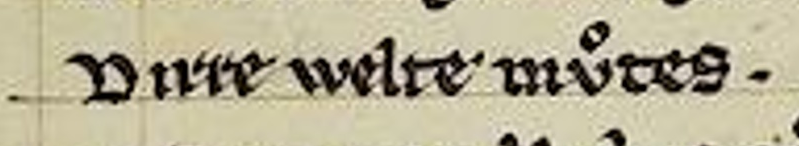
Dirre welte mv°otes.
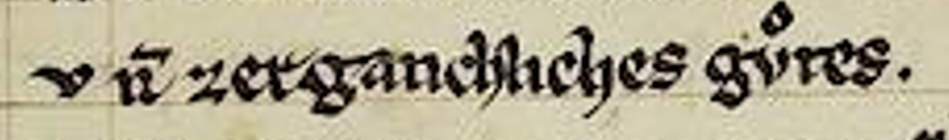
Vn(d) zerganchliches gv°otes.
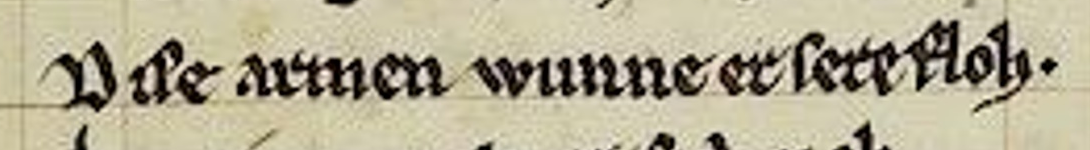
Diſe armen wunne er ſere floh.
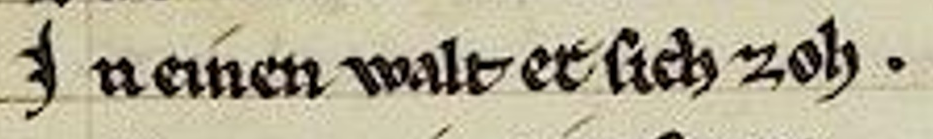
In einen walt er ſich zoh.
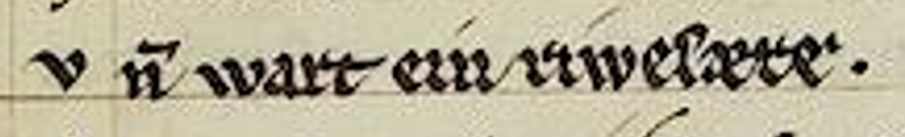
Vn(d) wart ein riweſ[ae]re.
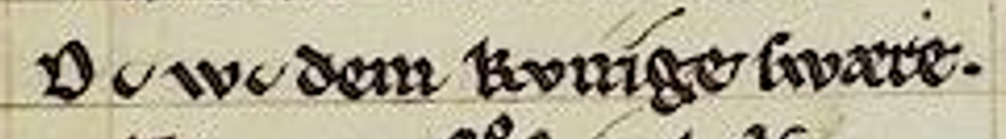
D(az) w(az) dem kvnige sw[ae]re.
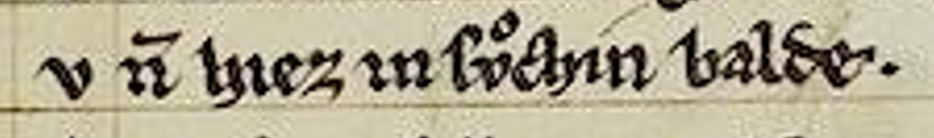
Vn(d) hiez in ſv°ochin balde.
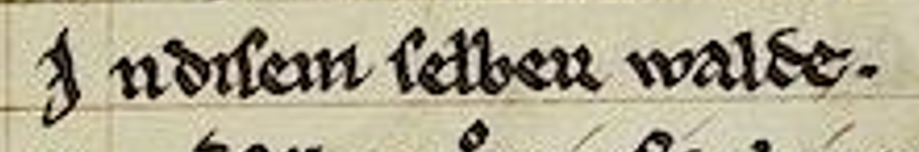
In diſem ſelben walde.
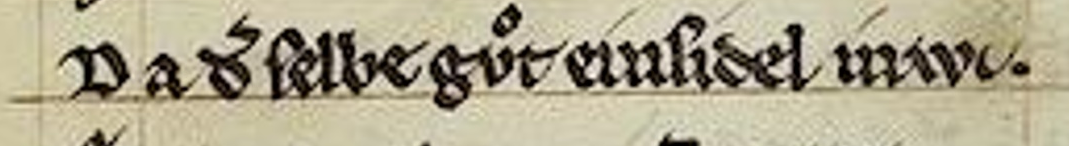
Da d(er) ſelbe gv°ot einſidel inw(az).
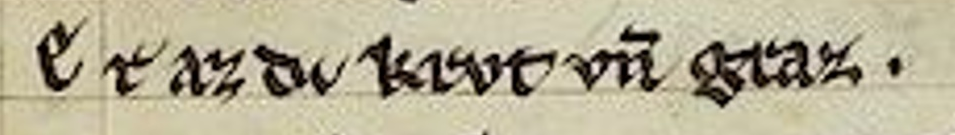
Er az d(az) krvt vn(d) graz.
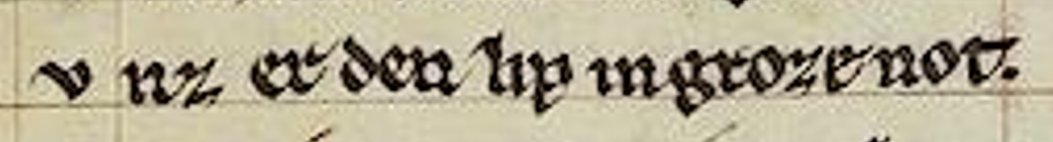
Vnz er den lip in groze not.
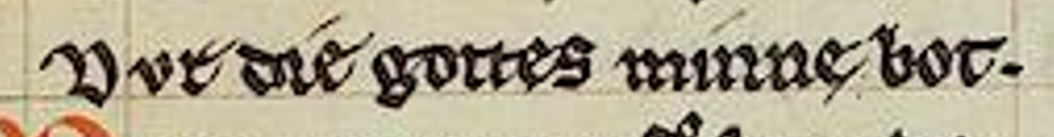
Dvr die gottes minne bot.
